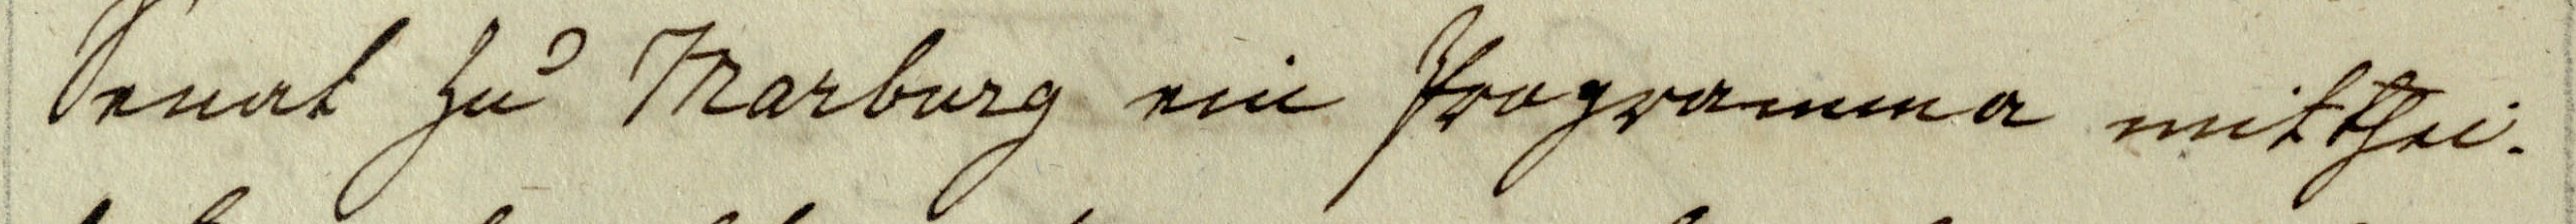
Senat zu Marburg ein Programma mitthei¬
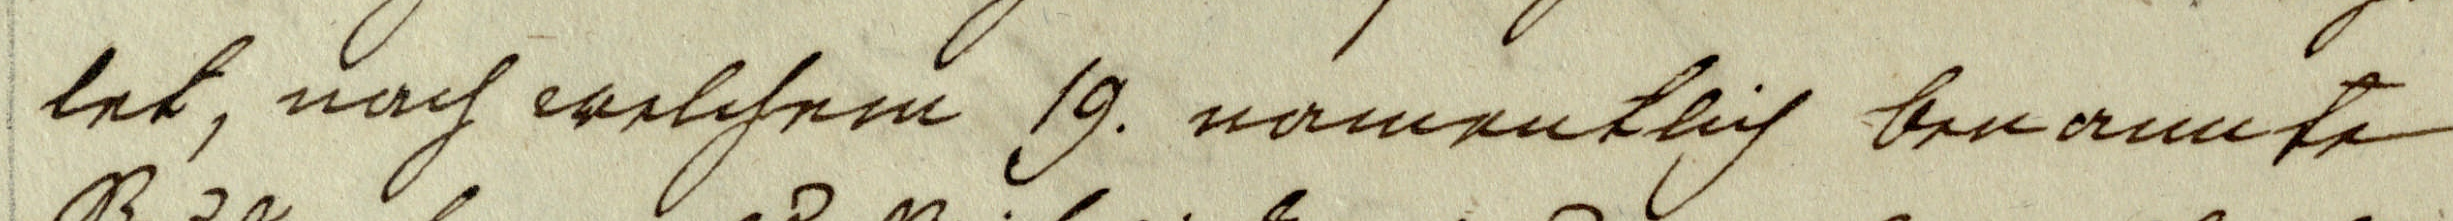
let, nach welchem 19. namentlich benannte
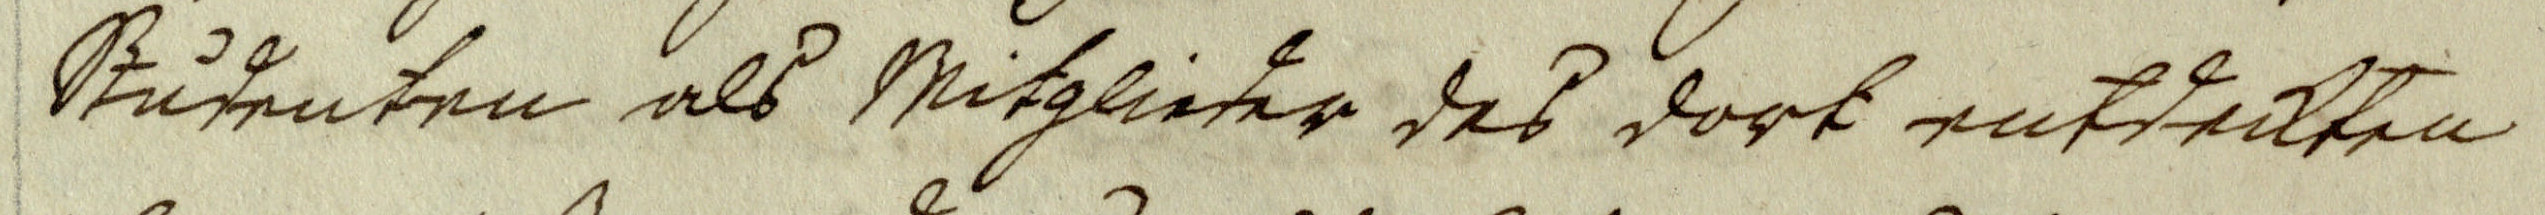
Studenten als Mitglieder des dort entdeckten
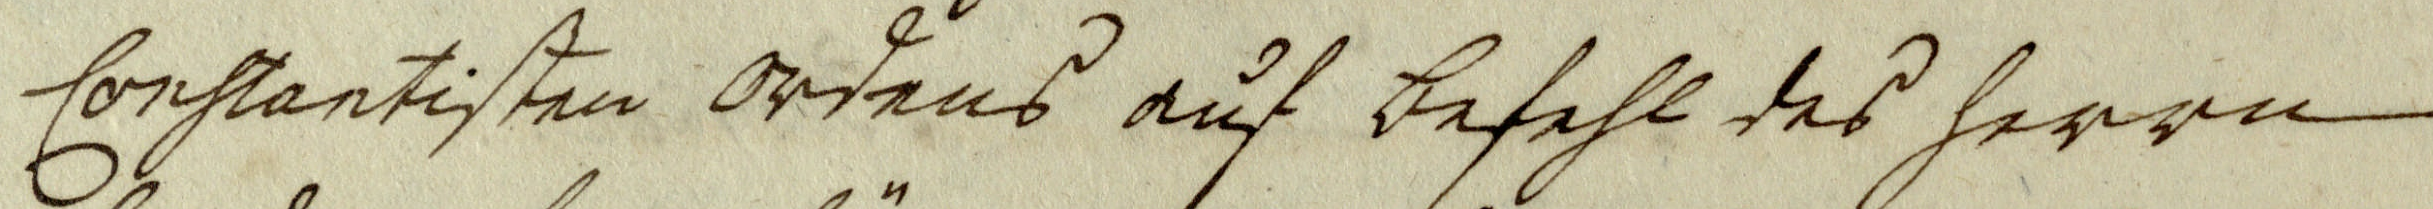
Constantisten Ordens auf Befehl des Herrn
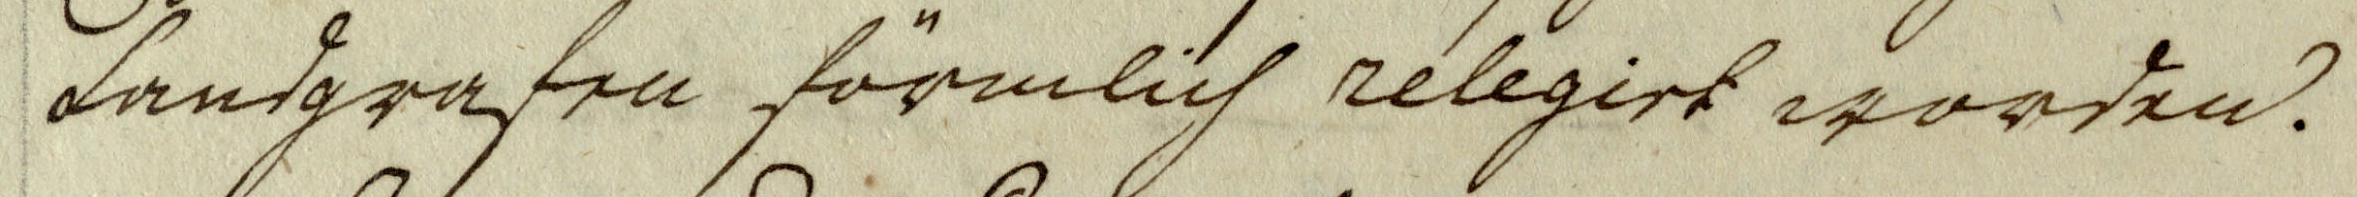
Landgrafen förmlich relegirt worden.
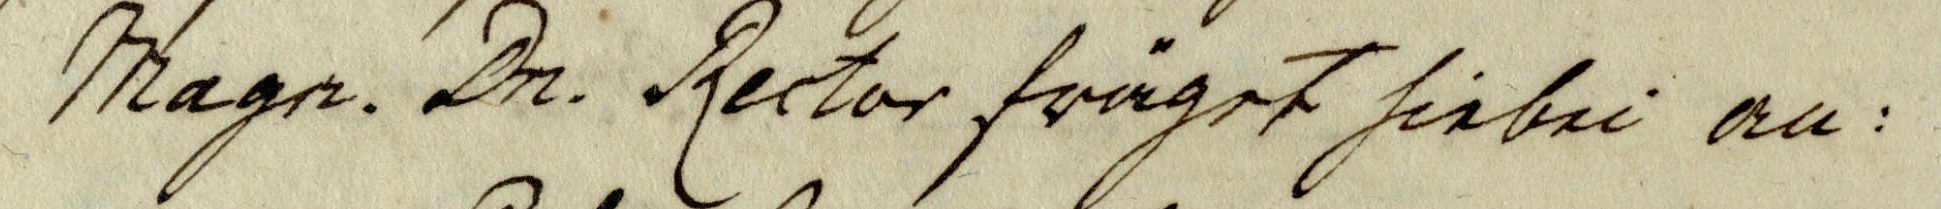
Magn. Dn. Rector fräget hiebei an:
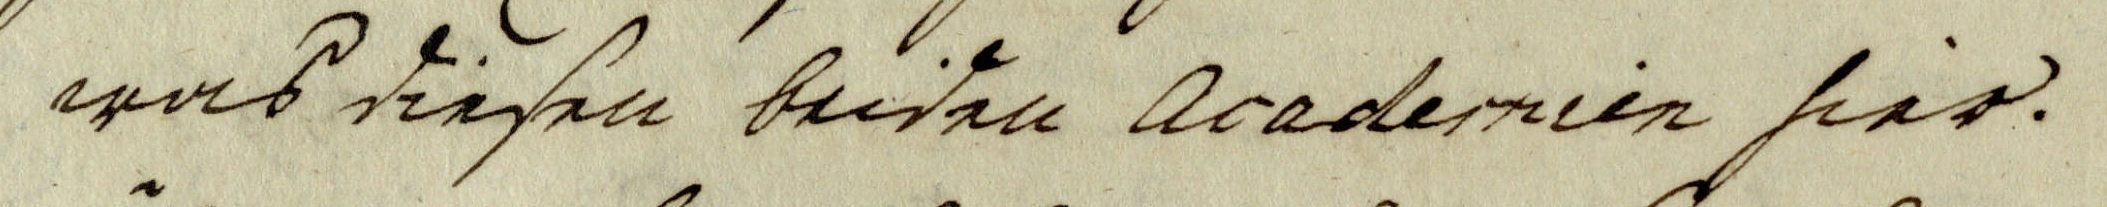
was diesen beiden Academien hier¬
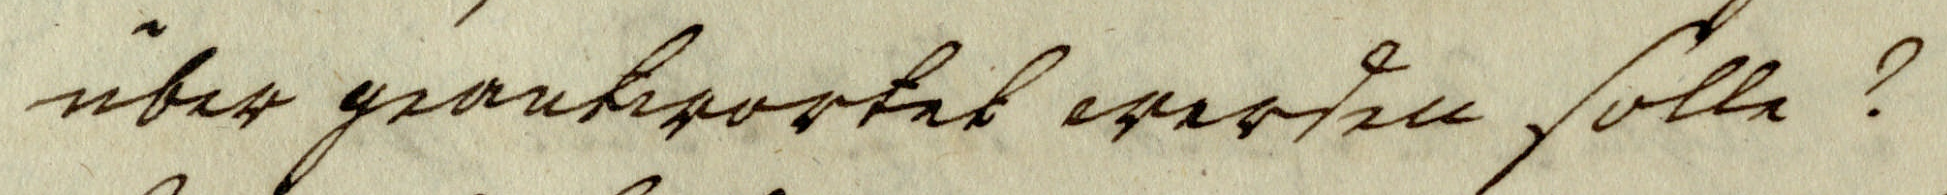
über geantwortet werden solle?
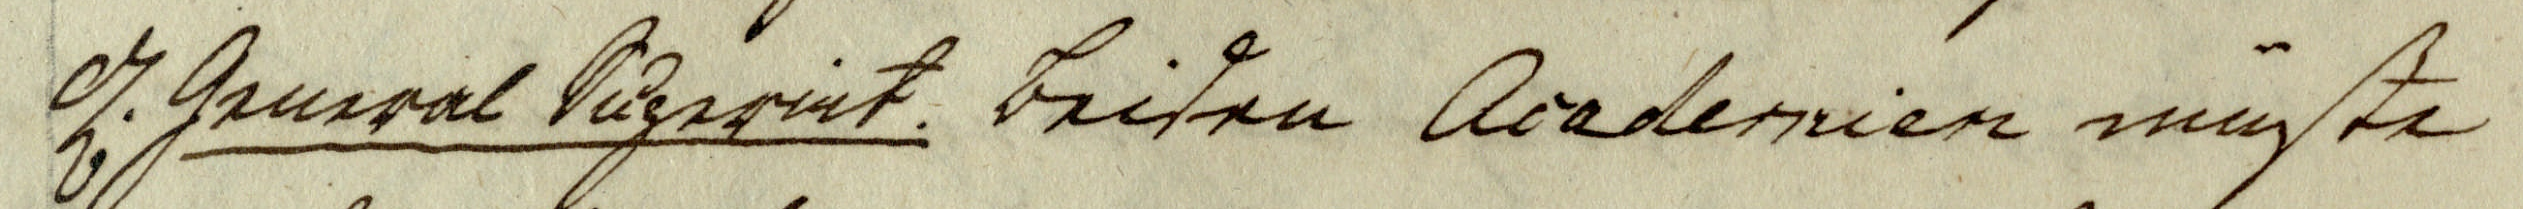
dh. General Superint. Beiden Academien müsste
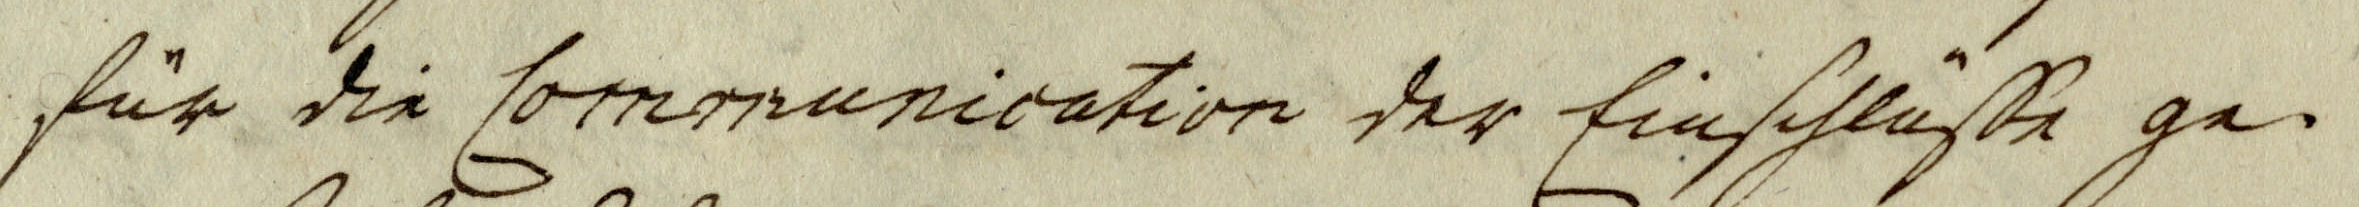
für die Communication der Einschlüsse ge¬
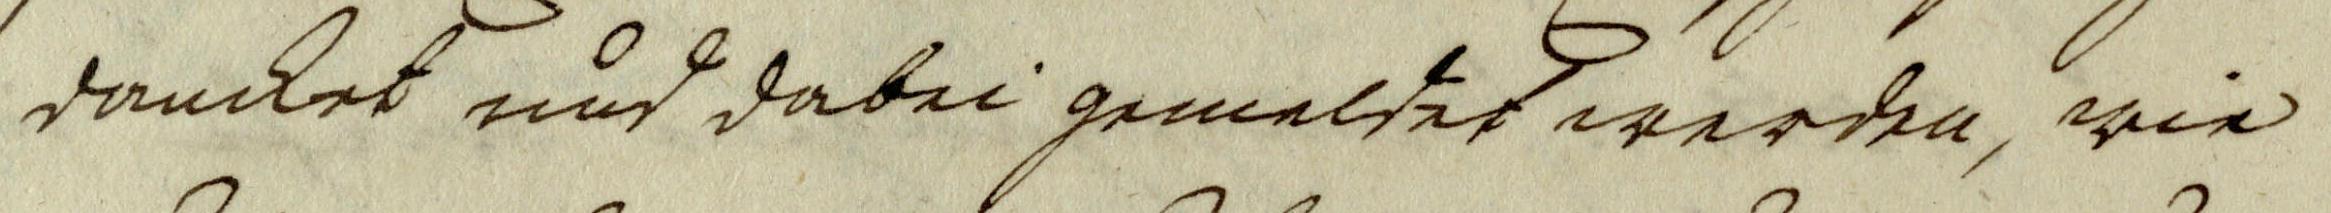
dancket und dabei gemeldet werden, wie
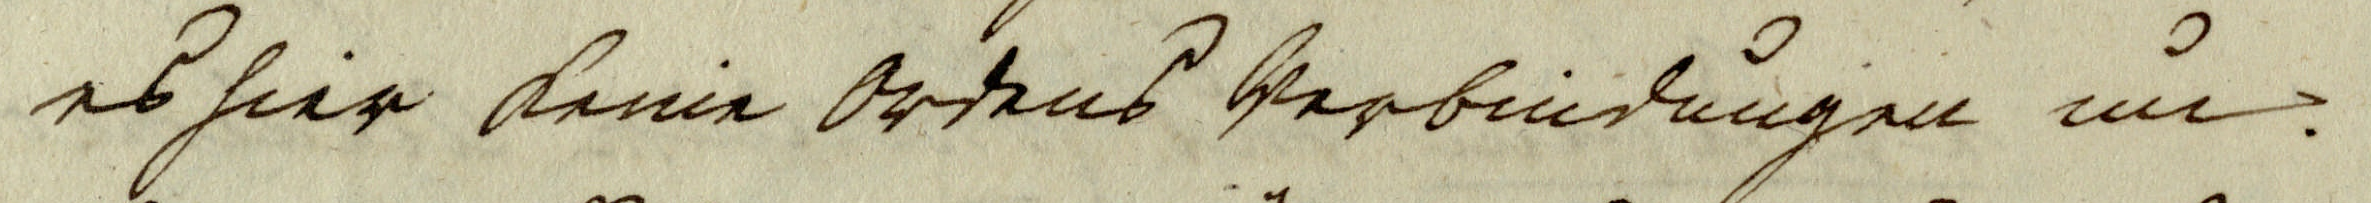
es hier keine Ordens Verbindungen un¬
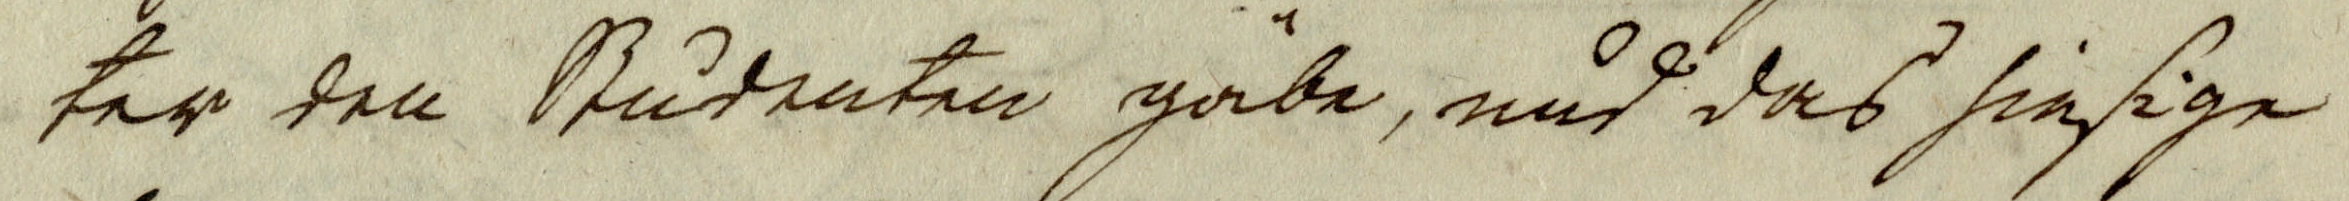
ter den Studenten gäbe, und das hiesige
